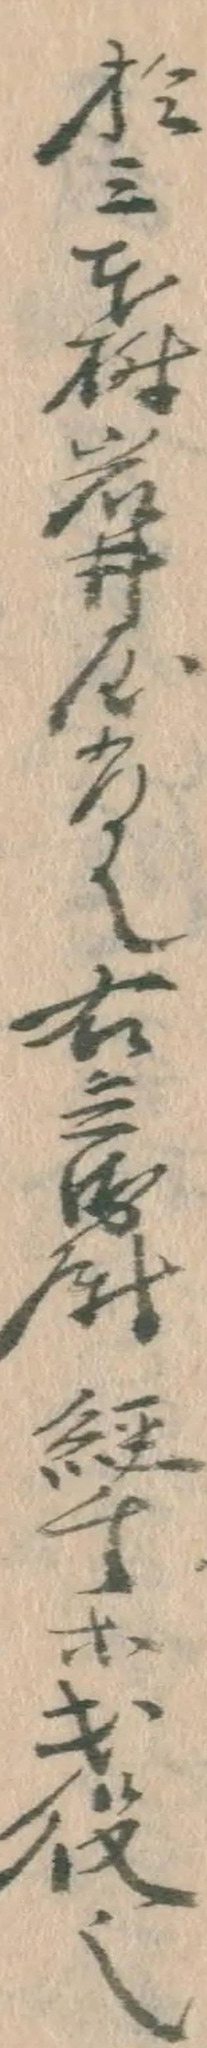於三本村岩井屋有之右兵衛尉経千等出役也
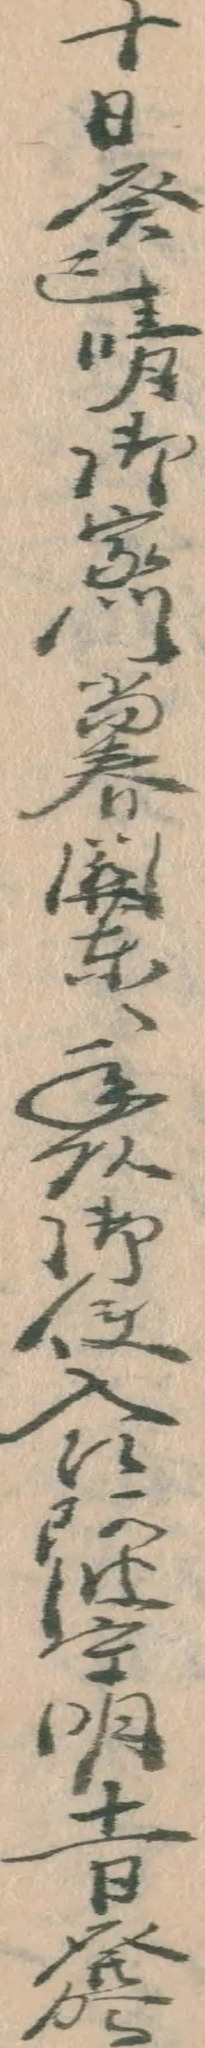十日癸巳晴御家門當春関東へ年頭御使入江阿波守明十一日発駕
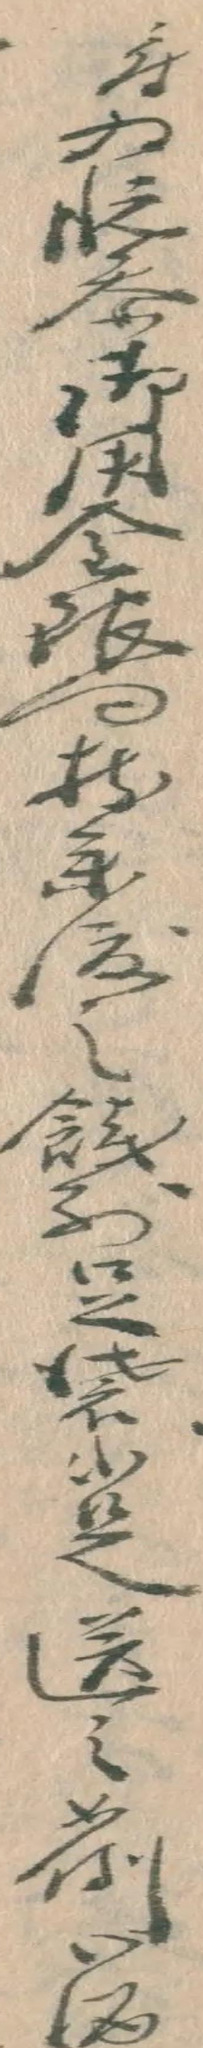ニ付為祝参御用金銀向持参渡之餞別足袋弐足送之如例御酒
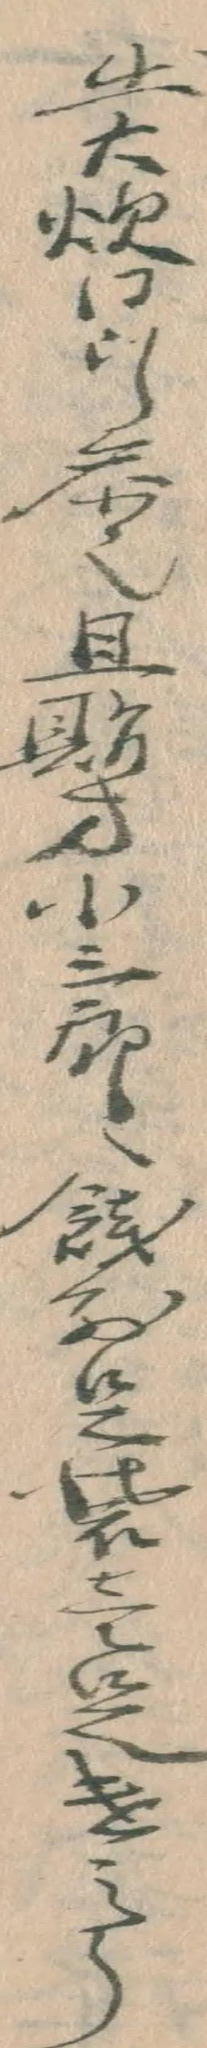出大炊同断参也且賄方小三郎へ銭別足袋壱足遣之了
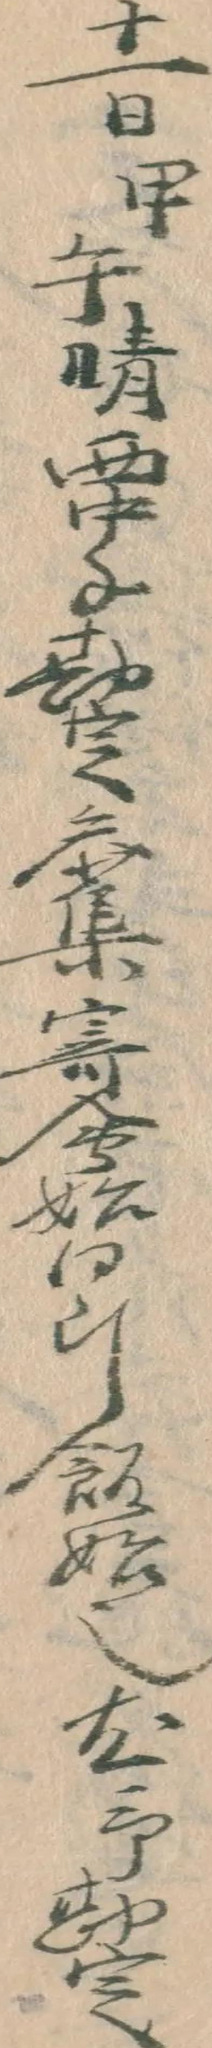十一日甲午晴西中手勘定参集寄會始同断飯始也尤予勘定
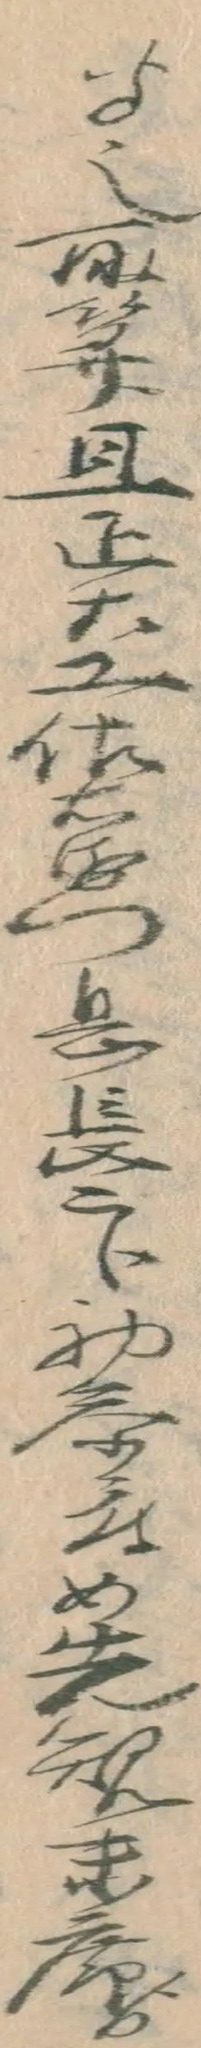聞之取算且大工佐右衛門息長二郎初参ニ付先規末席ゟ
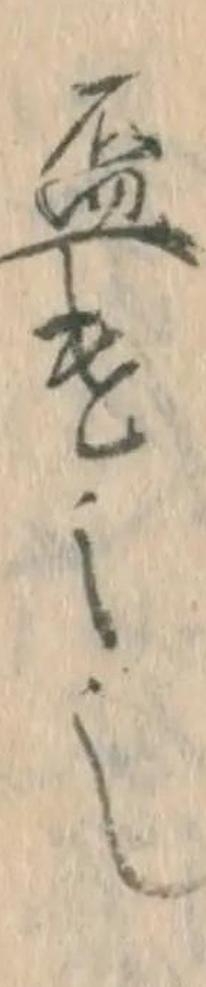盃遣之也
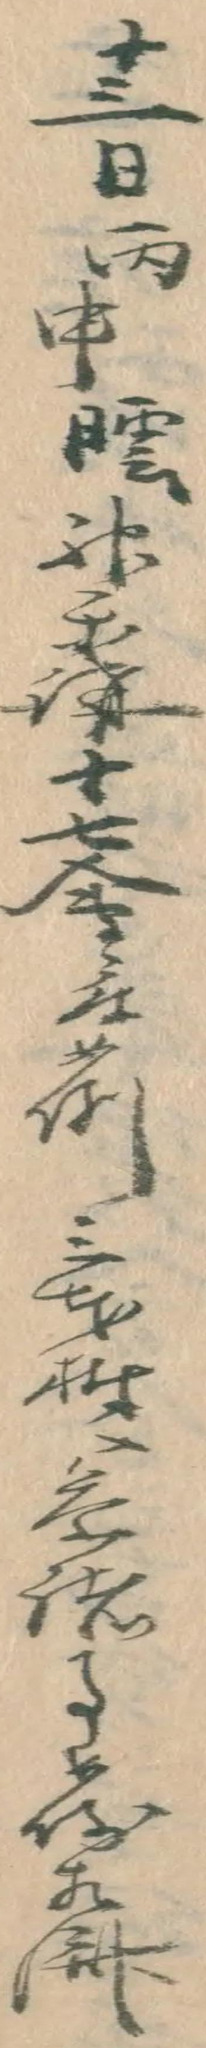十三日丙申曇神楽講十七會ニ付如何三本樹へ参諸事如例相済

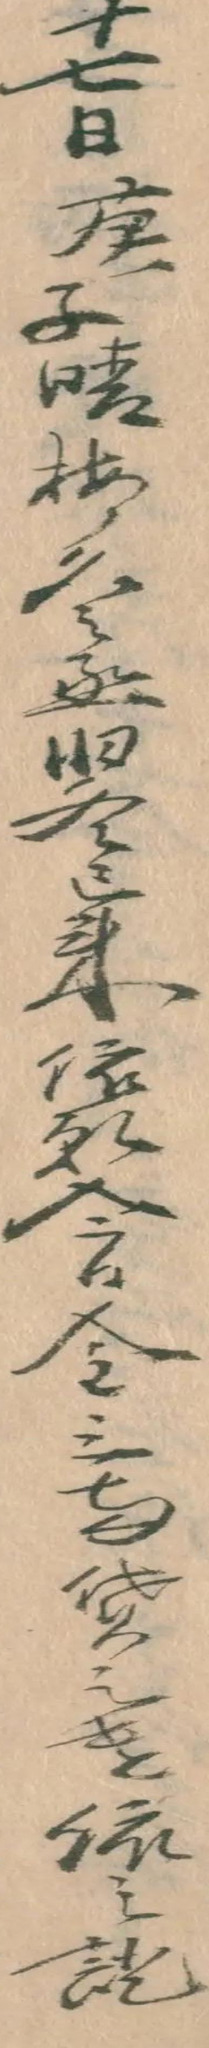十七日庚子晴梅ノ久之丞旧冬已来依願今日金三両貸之遣依之證
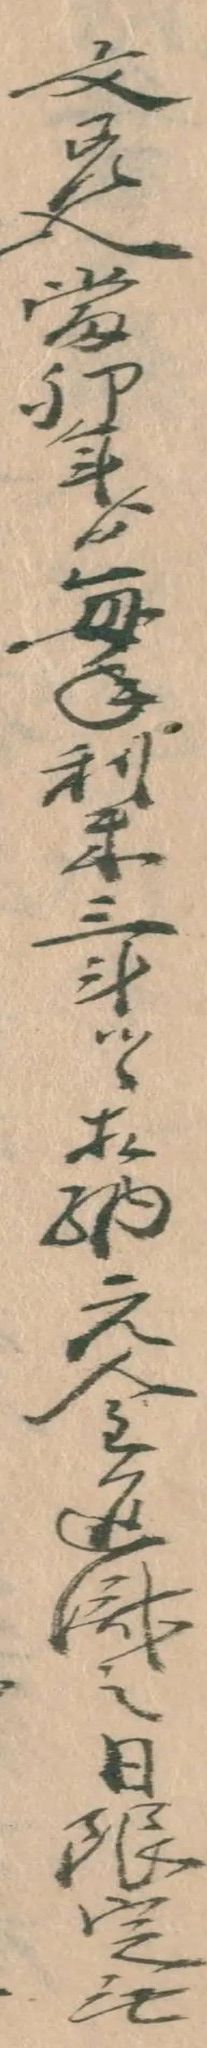文差入當卯年ゟ毎年利米三斗ツヽ相納元金返済之日限定無
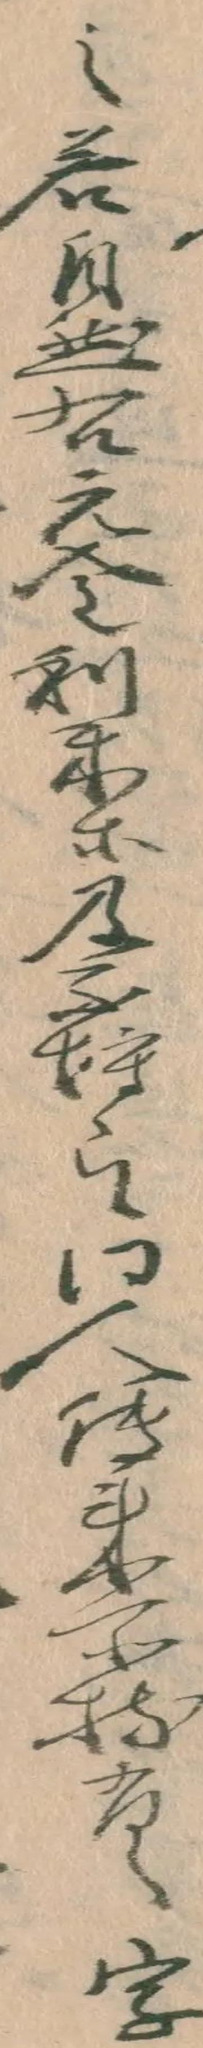之若自然右元金利米等及不埒候ハヽ同人傳来所持有之字
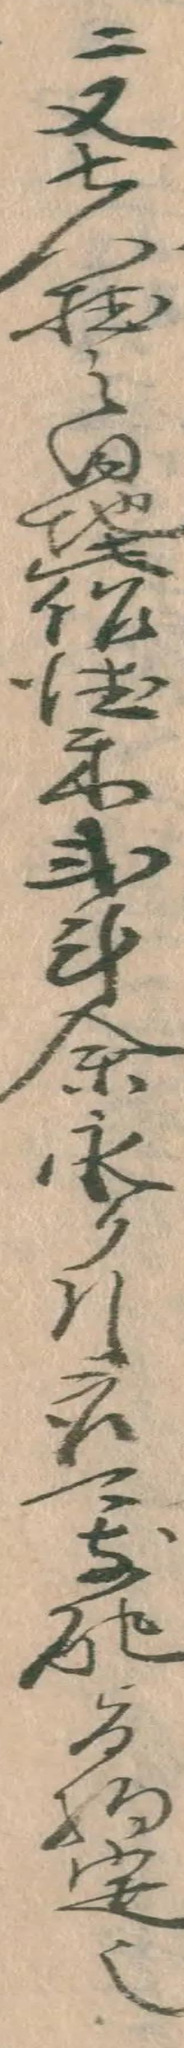ニ又七人掛之田地作徳米弐斗余永ク引取可支配旨約定也
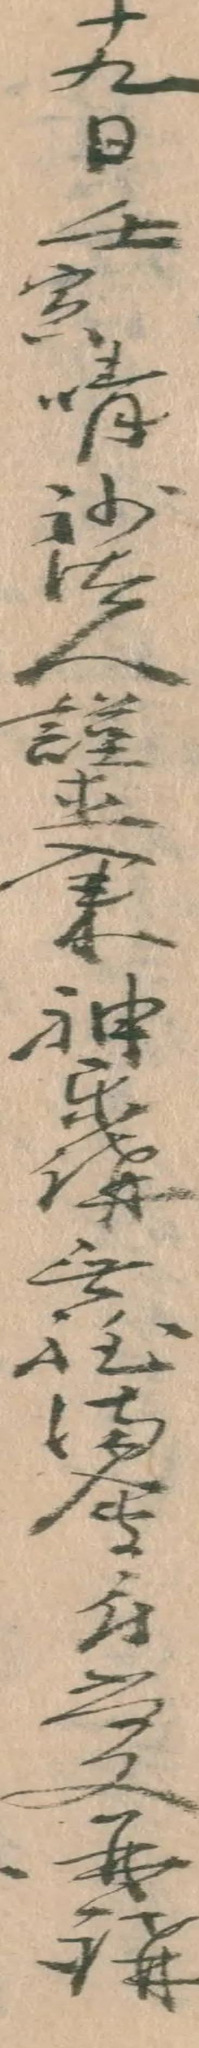十九日壬寅晴沙汰人謹直入来神楽講無程満會ニ付尚又再講
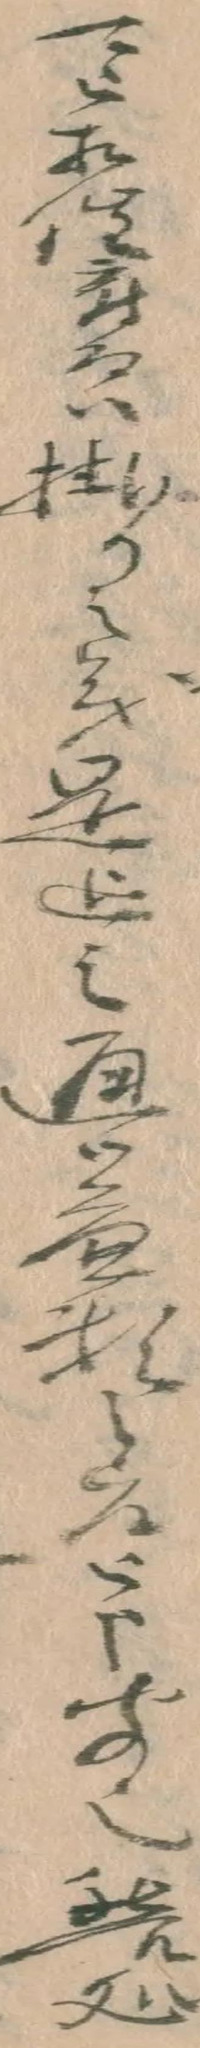可被相催ニ付而ハ掛り之義是迄之通御益頼之旨被申聞也然ル処
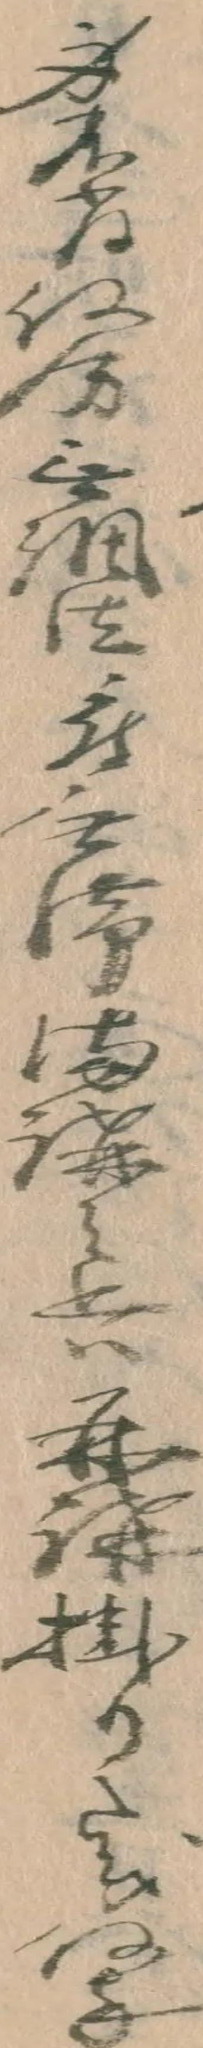身不肖何分無調法ニ付無滞満講之上ハ再講掛りたき何卒
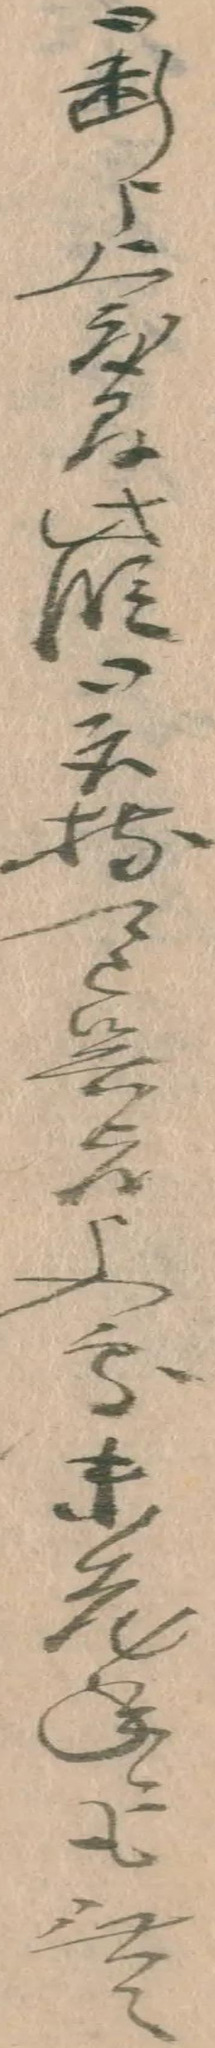御断申上度間此段御取持可被呉旨申入處未老年にも無之
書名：賀茂社記録. 第66冊
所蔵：国立国会図書館 National Diet Library, JAPAN
